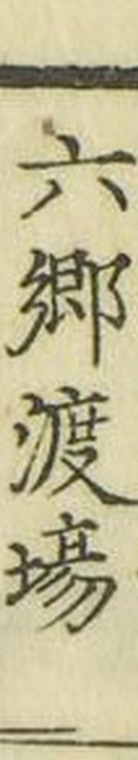六郷渡塲

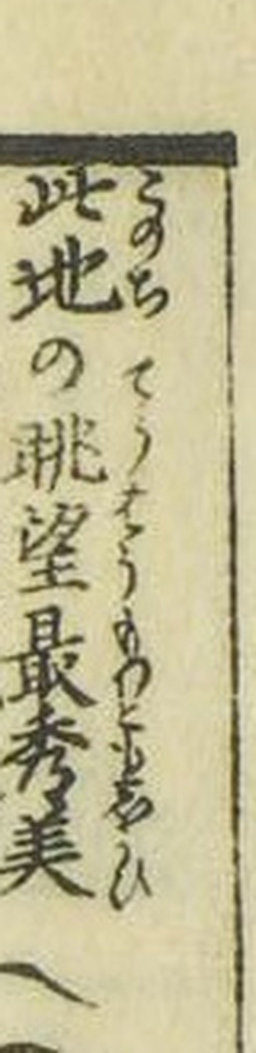此地の眺望最秀美
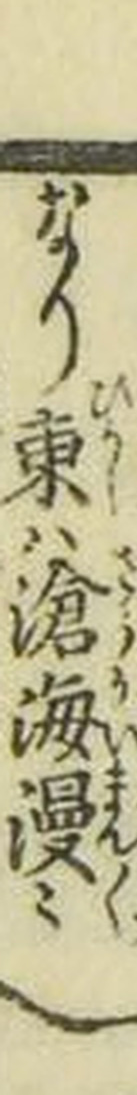なり東は滄海漫々
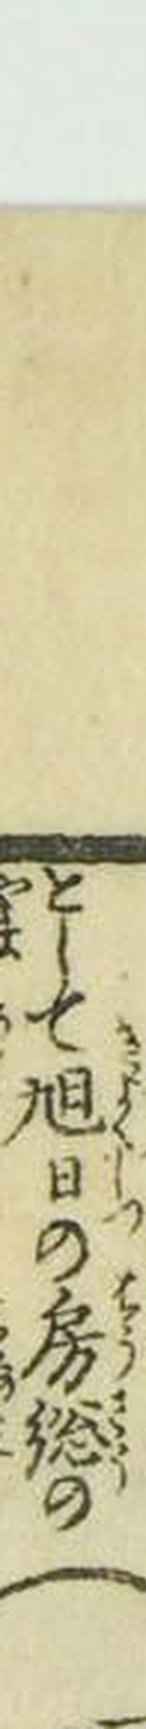として旭日の房総の
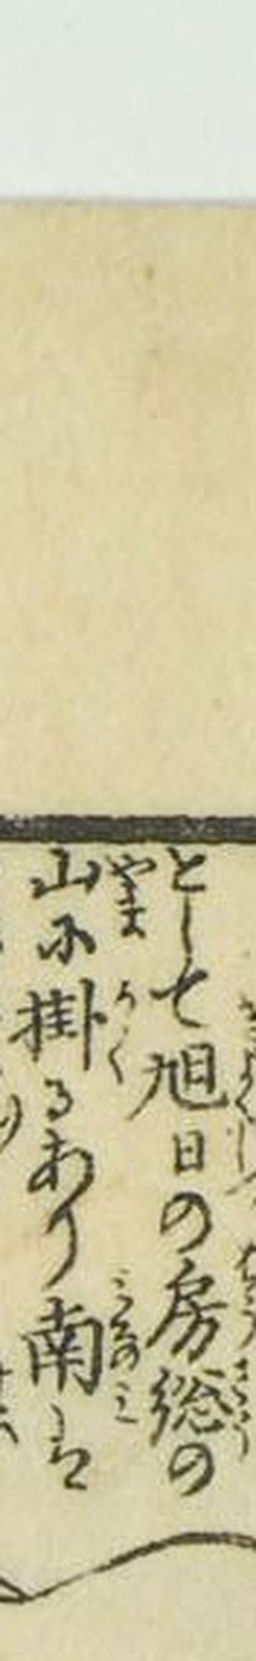山に掛るあり南は
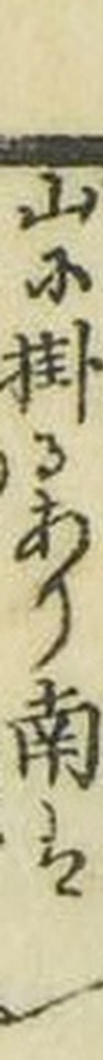山に掛るあり南は
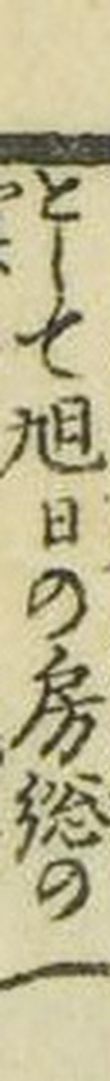として旭日の房総の
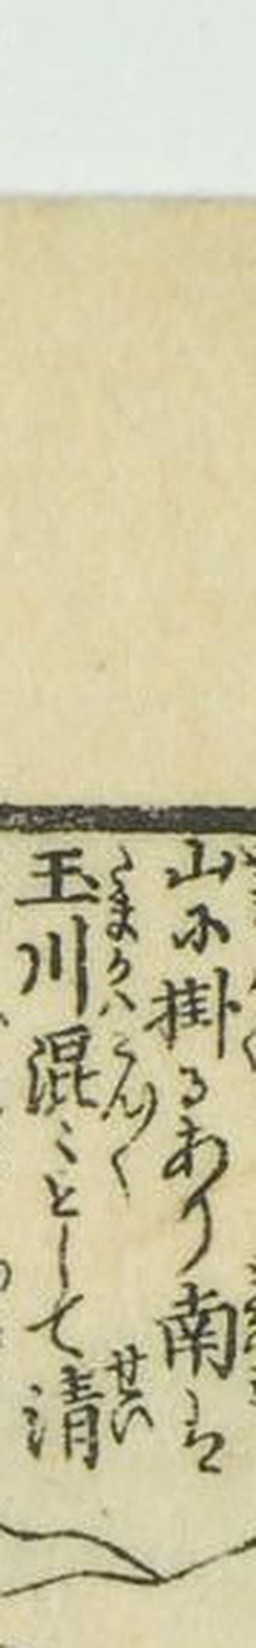玉川混々として清
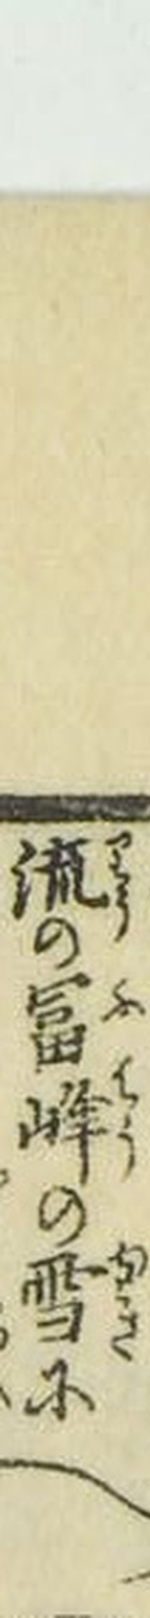流の冨峰の雪に
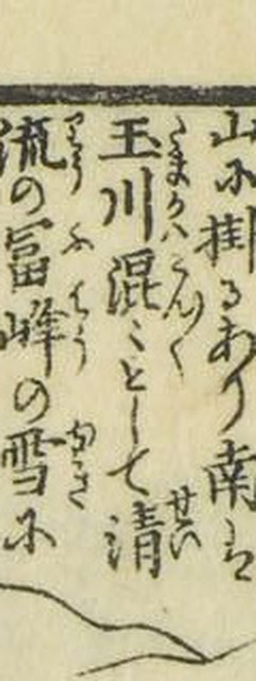玉川混々として清
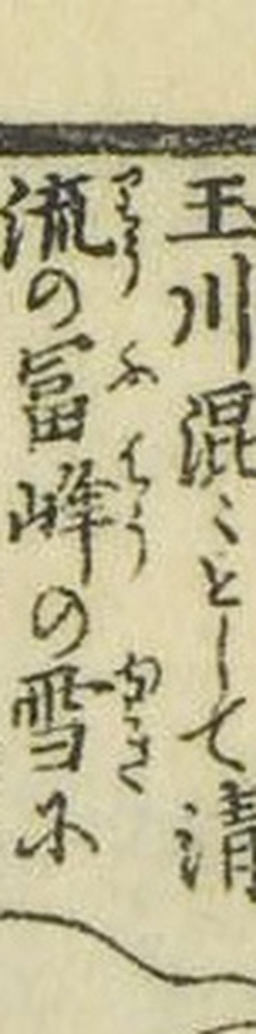流の冨峰の雪に
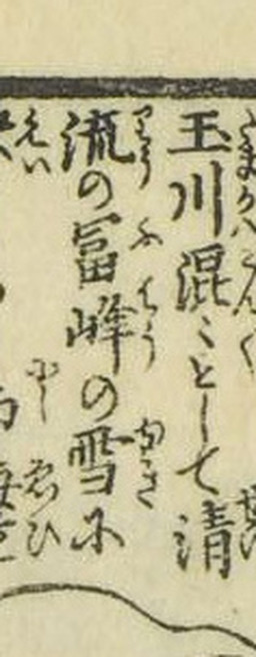流の冨峰の雪に
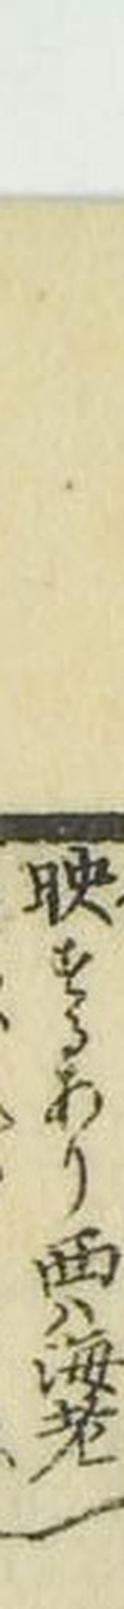映するあり西は海老
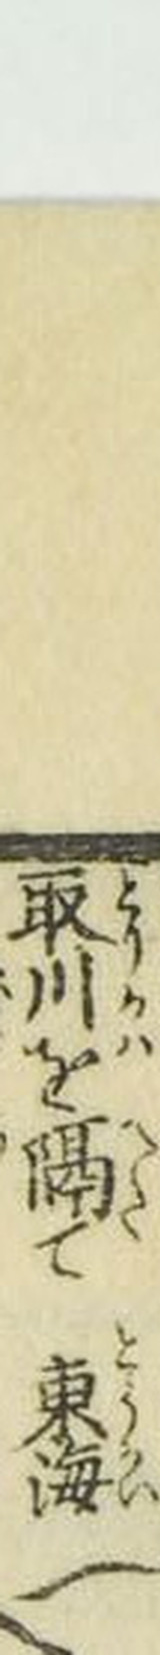取川を隔て東海
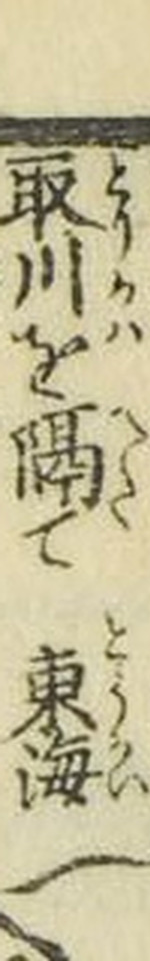取川を隔て東海
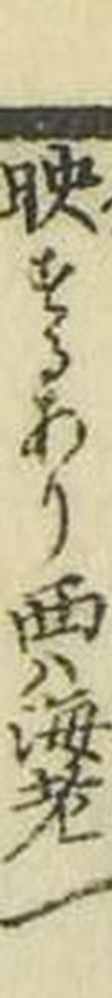映するあり西は海老
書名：江戸名所図会 20巻 巻之4
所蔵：東京学芸大学教育コンテンツアーカイブ
